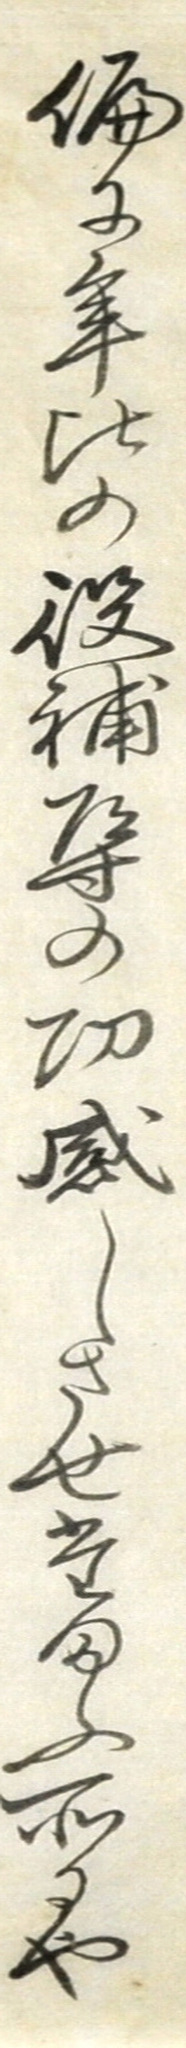偏に年比の役補導の功感しさせたまふ所にや

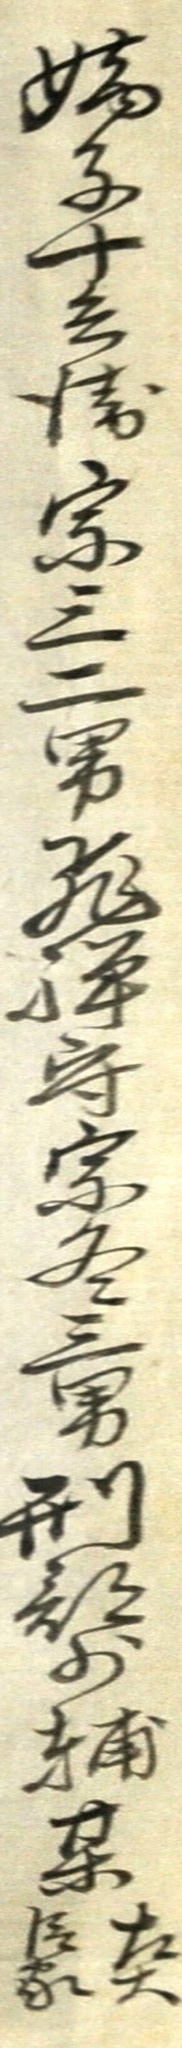嫡子十兵衛宗三二男飛騨守宗冬三男刑部少輔某左大臣家
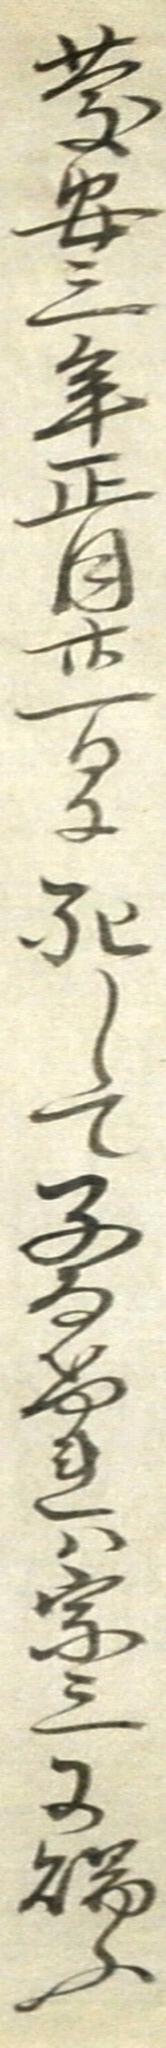慶安三年正月廿一日に死して子なけれは宗三に賜ふ
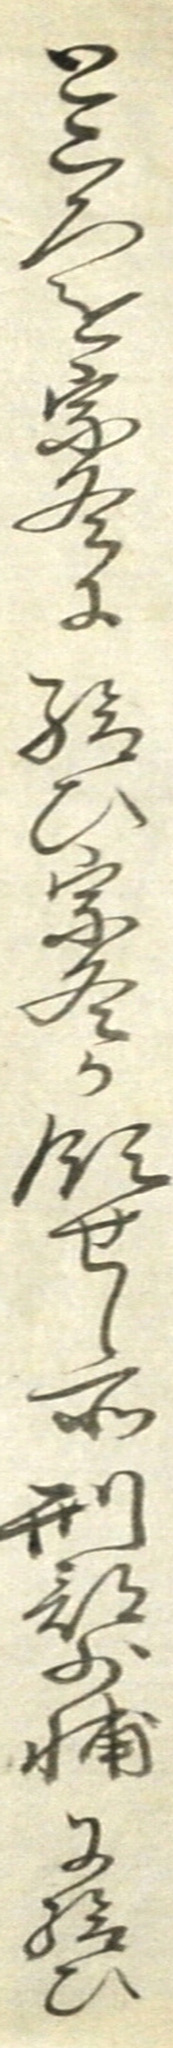ところを宗冬に給ひ宗冬か領せし所刑部少輔に給ひ
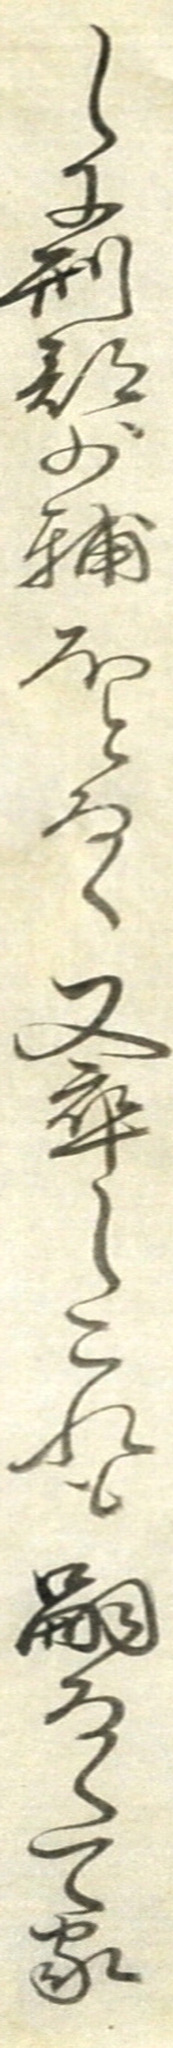しに刑部少輔ほとなく又卒しこれも嗣なくて家
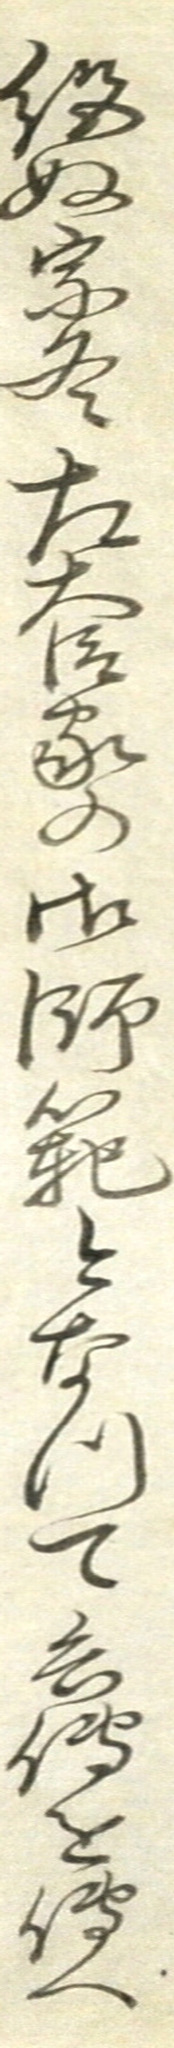絶ぬ宗冬左大臣家の御師範となつて兵伝を伝へ
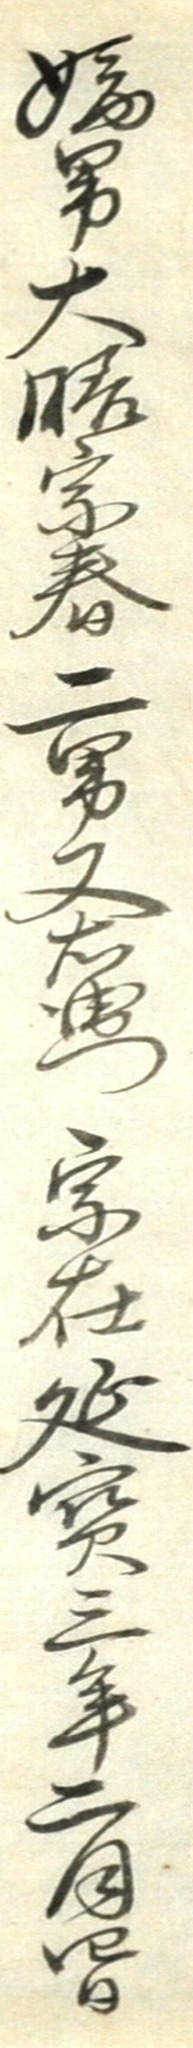嫡男大膳宗春二男又右衛門宗在延宝三年二月四日
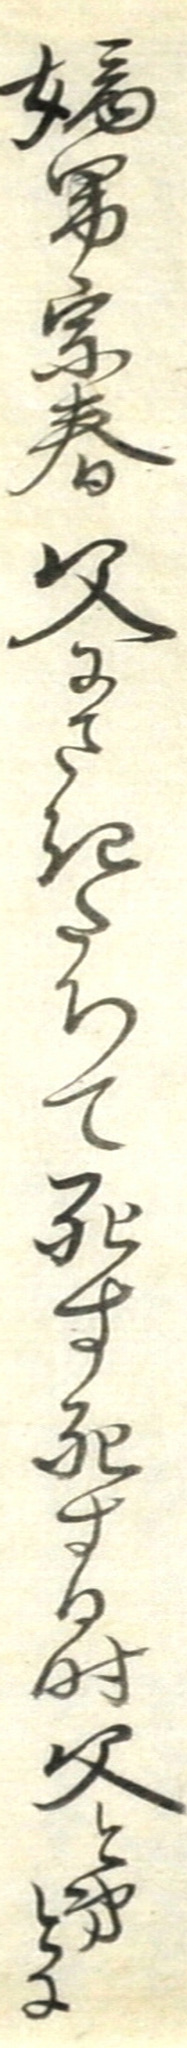嫡男宗春父にさきたちて死す死する時父と弟とに
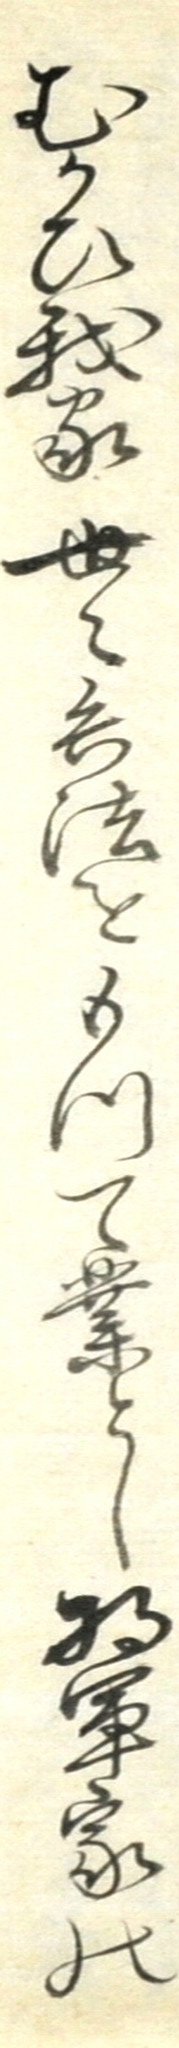むかひ我家世々兵法をもつて業とし将軍家の
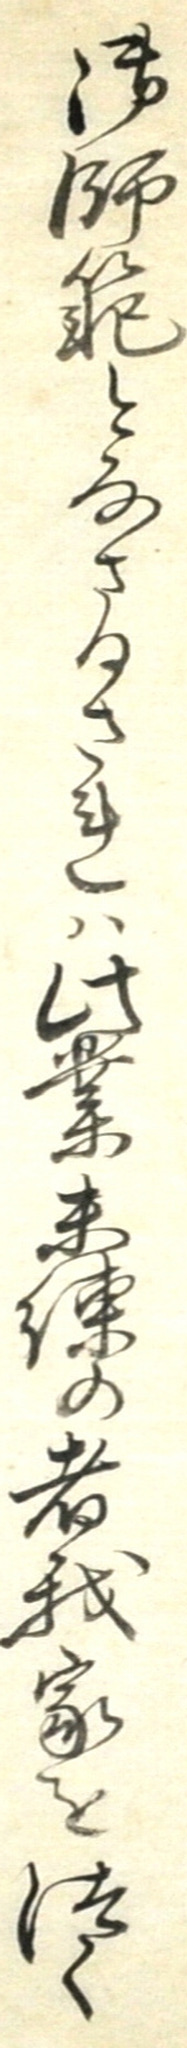御師範となさるされは此業未練の者我家をつく
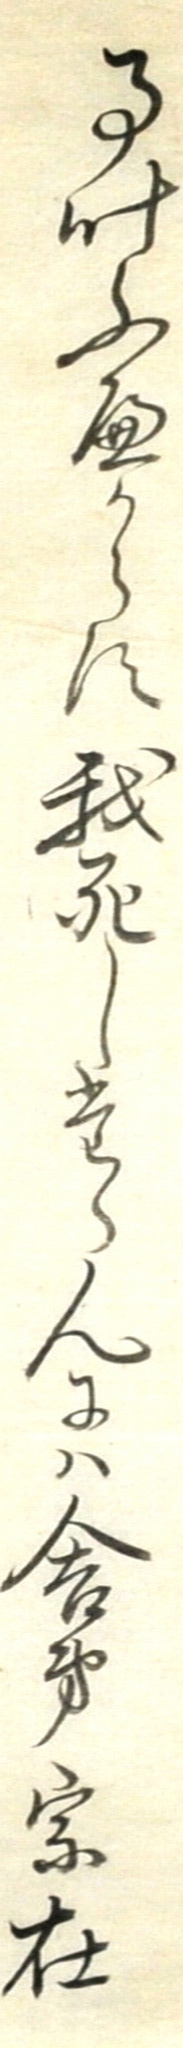事叶ふへからす我死したらんには舎弟宗在
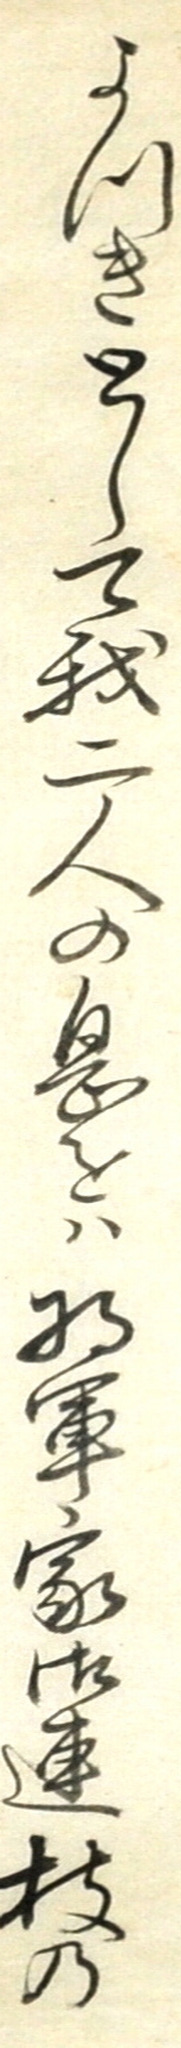よつきとして我二人の息をは将軍家御連枝の
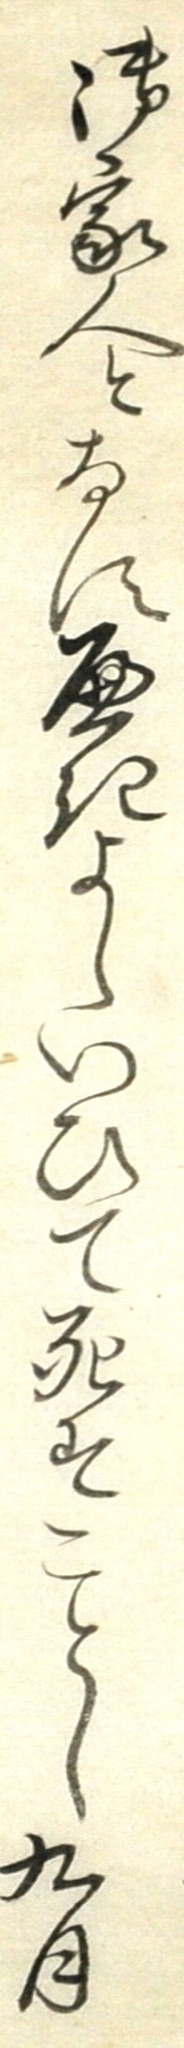御家人となすへきよしいひて死すことし九月
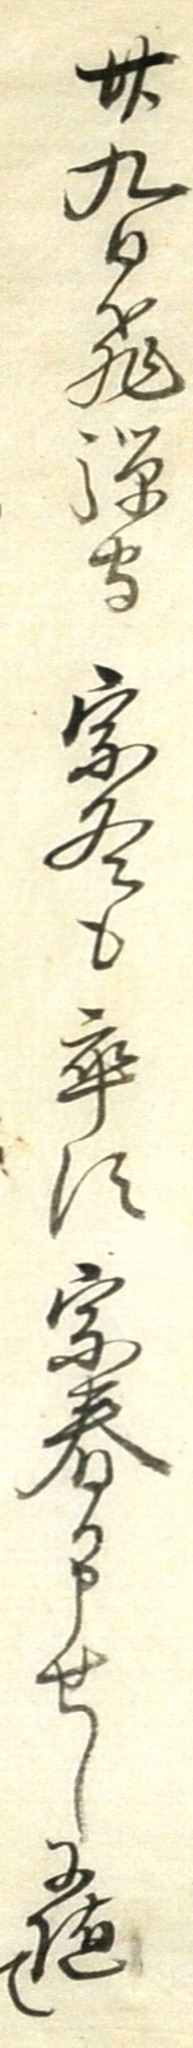廿九日飛騨守宗冬も卒す宗春か申せしに随て
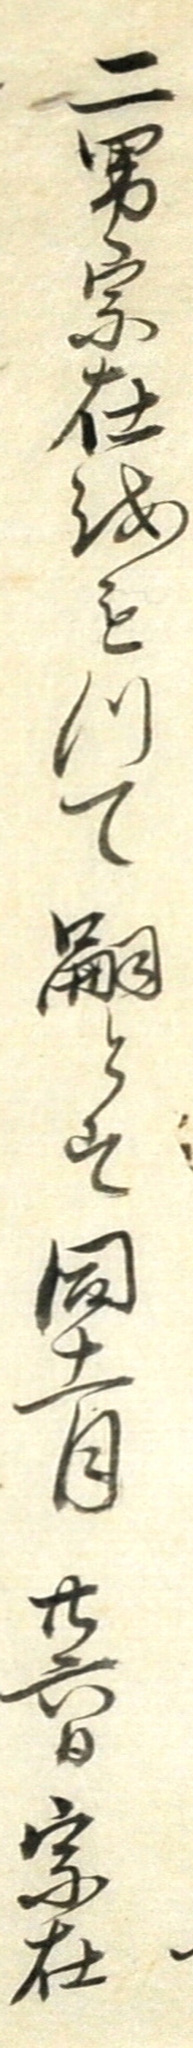二男宗在をもつて嗣とす同十一月廿六日宗在
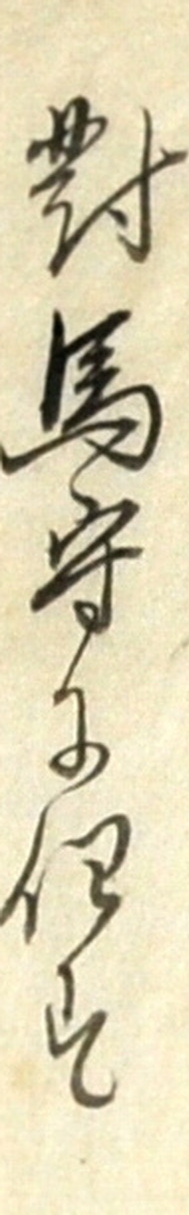対馬守に任す
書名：藩翰譜（六）
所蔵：伊那市立高遠町図書館・合同会社AMANE
